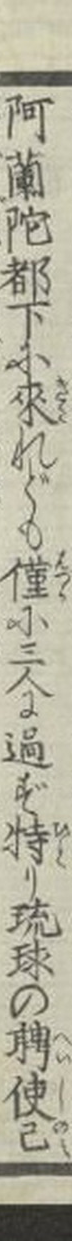阿蘭陀都下に来れども僅に三人に過ず特り琉球の聘使已
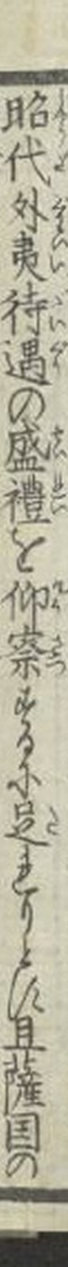昭代外夷待遇の盛礼を仰察するに足れりとす且薩国の
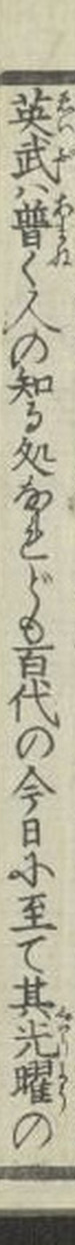英武は普く人の知る処なれども百代の今日に至て其光曜の
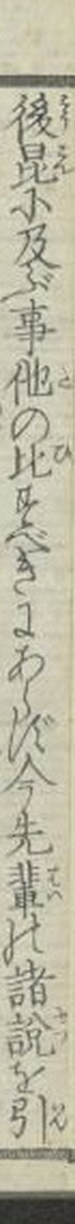後昆に及ぶ事他の比すべきにあらず今先輩の諸説を引
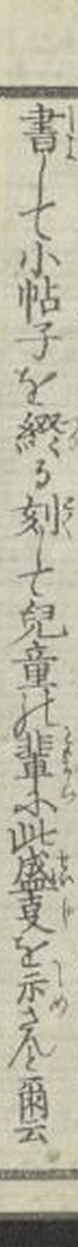書して小帖子を綴る刻して児童の輩に此盛事を示さんと爾云
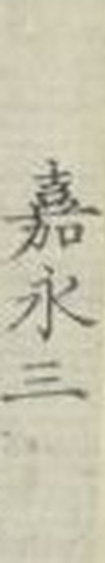嘉永三
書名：中山国使略
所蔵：University of the Ryukyus Library
